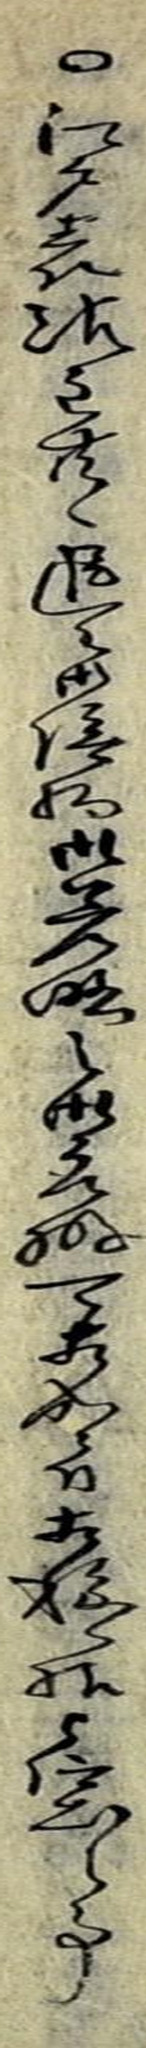〇江戸表銀主共へ追々御倹約御差略之御取扱可相成ニ付相候様被仰出候事
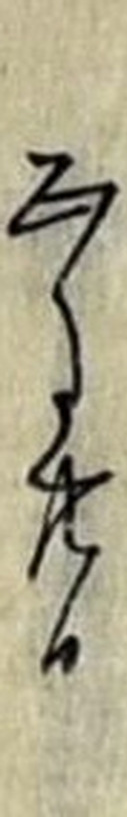正月廿日
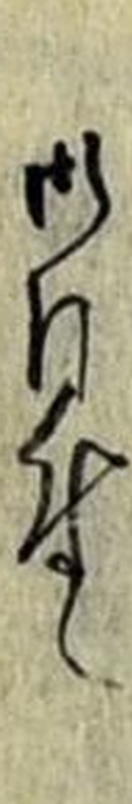御目付へ
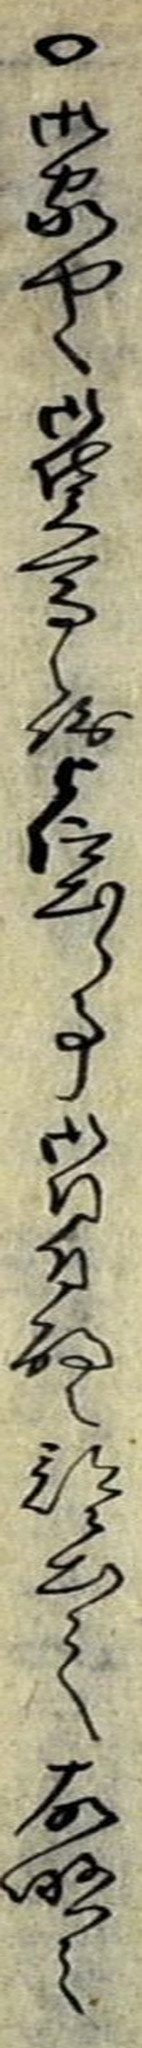〇御家中へ御貸馬之儀被仰出候事御目付触候部ニ出之故略之
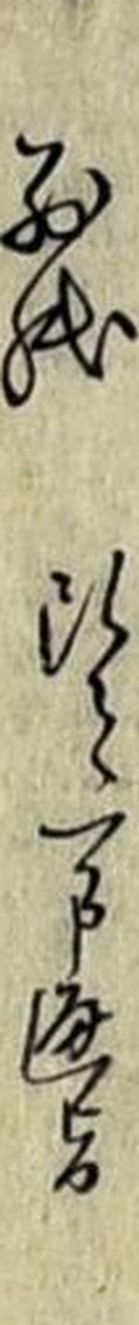別紙頭々へ可申通旨
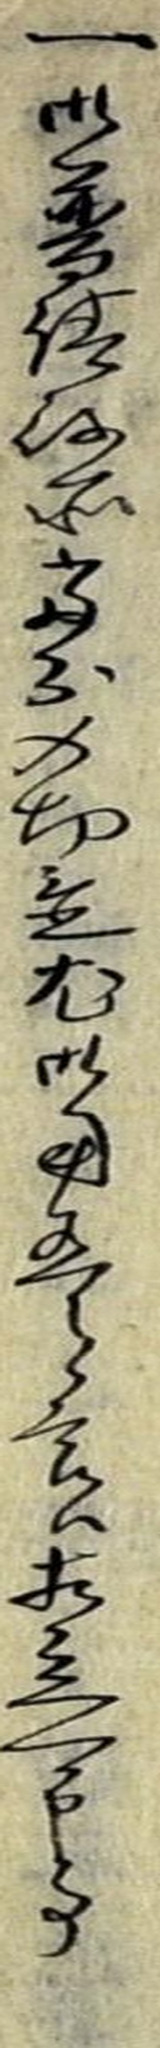一御普請役所当分〆切置尤御用有之節ハ相立可申事
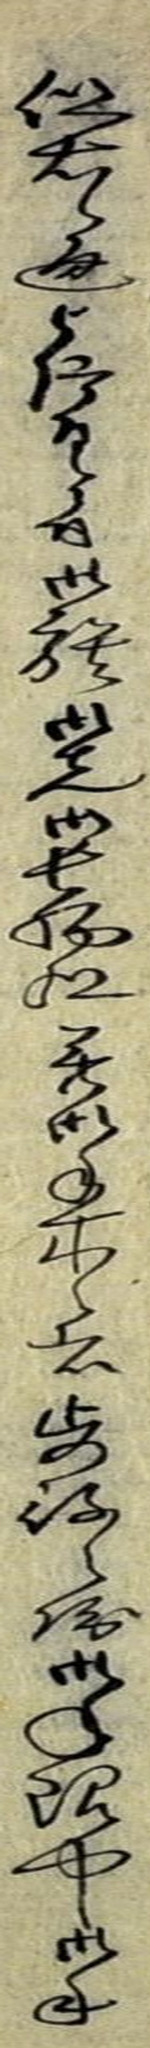但右之通被仰付候ニ付御旗御先御長柄組并御手木之者歩役之儀御年限中御手
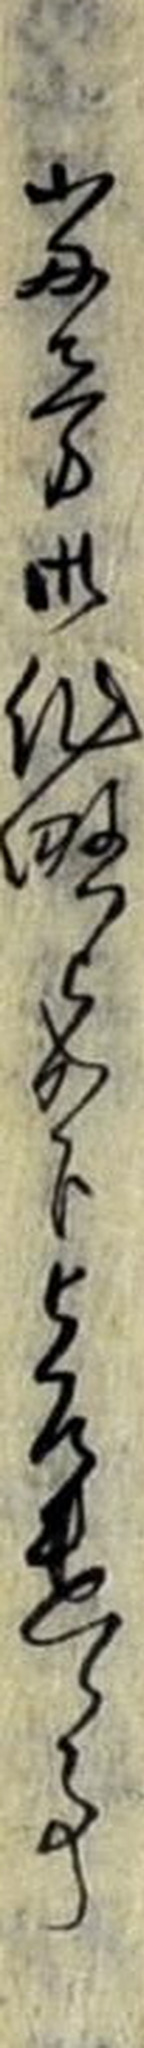当旁御作略被成下被召遣候事
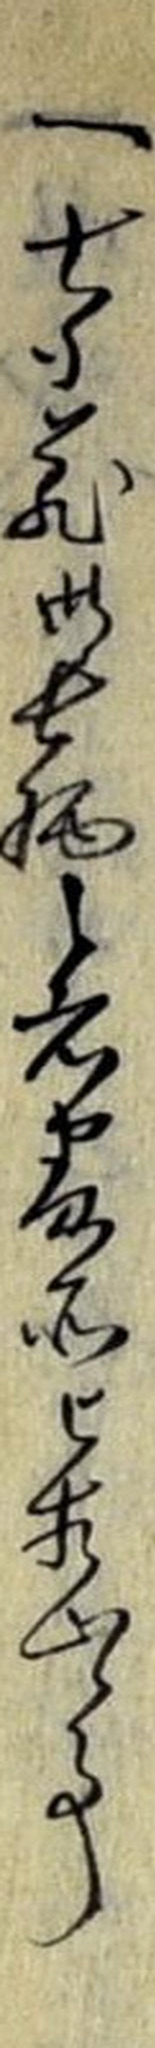一七ツ蔵御長柄之者番所被相止候事
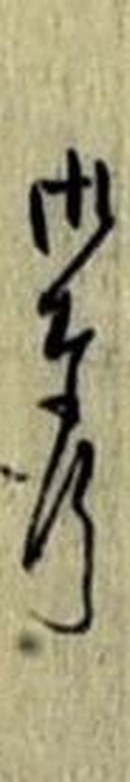御奉行
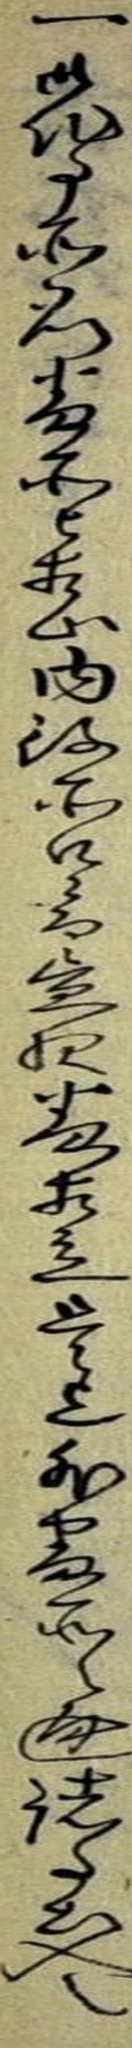一御作事所御門番所被相止内役所口ニ而昼夜番相立是迄外番所之通諸事出入之
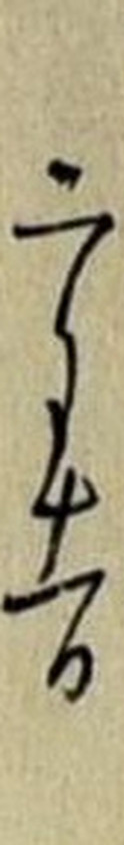二月十一日
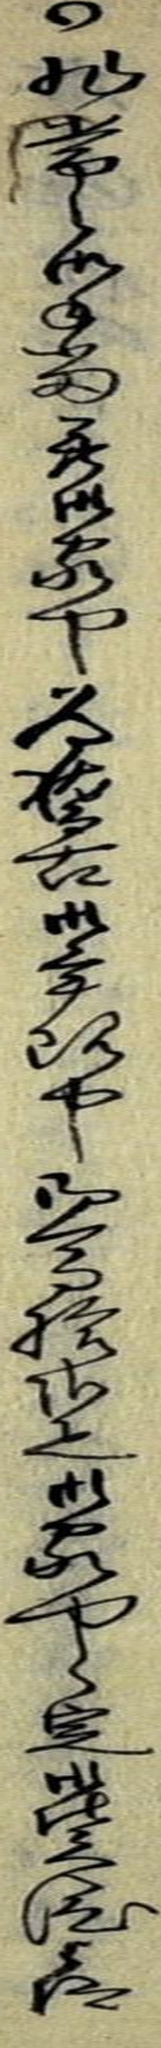〇非常之御手当并御家中為稽古御年限中御馬拾弐疋御家中へ定御貸渡被仰
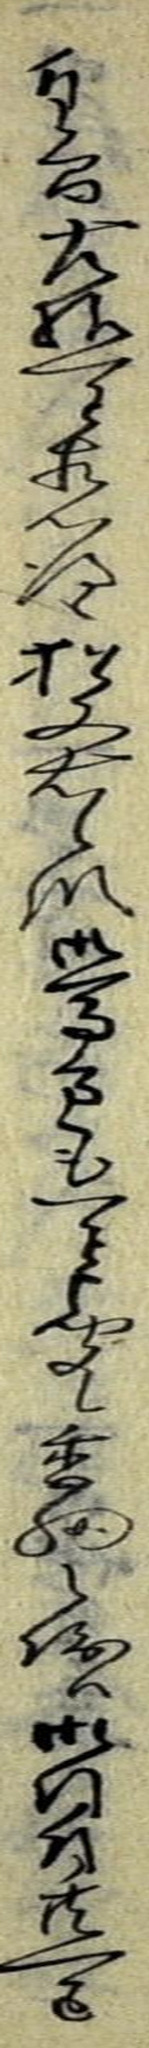付候間左様可被相心得候猶又右之段御馬方へも可被申聞候委細之儀ハ御目付共可被
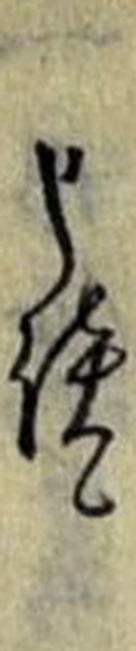申談候
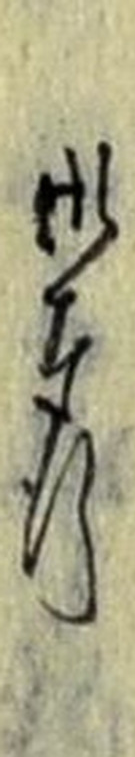御奉行
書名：命令之部 三
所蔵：福井県文書館 Fukui Prefectural Archives
